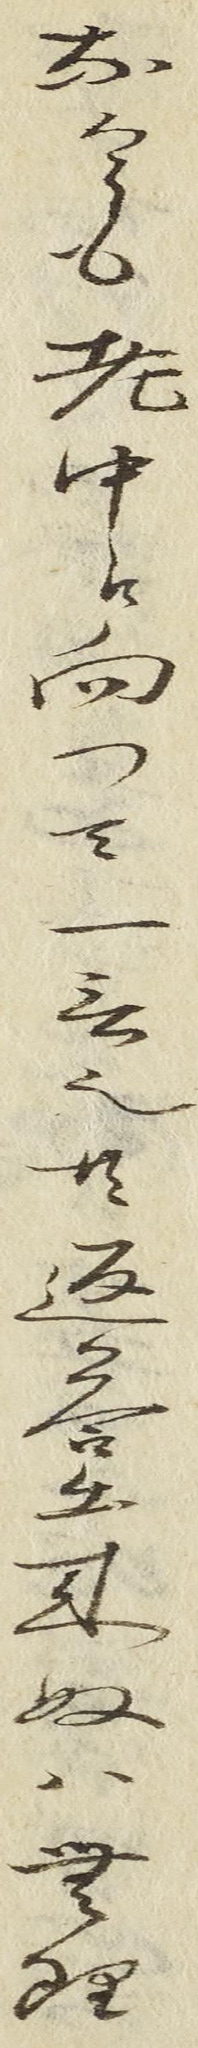なか二も老中江向つて一言也共返か答出来ぬハ無理
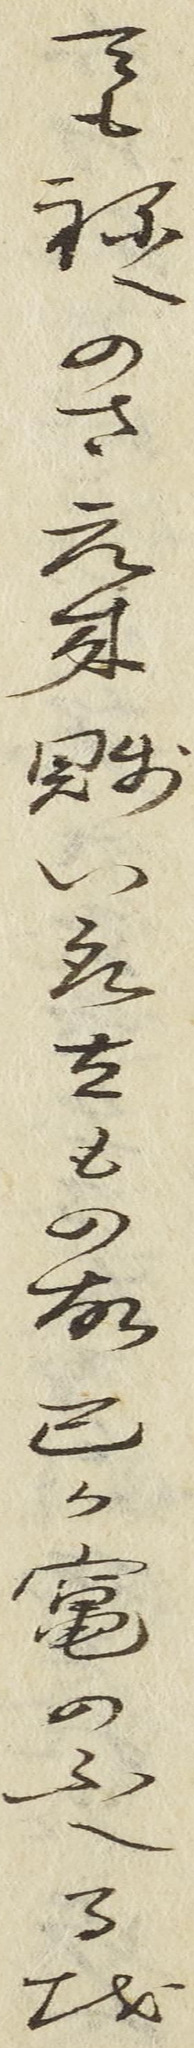てもねへのさ元来賎い取立もの故己か竃のふへるを
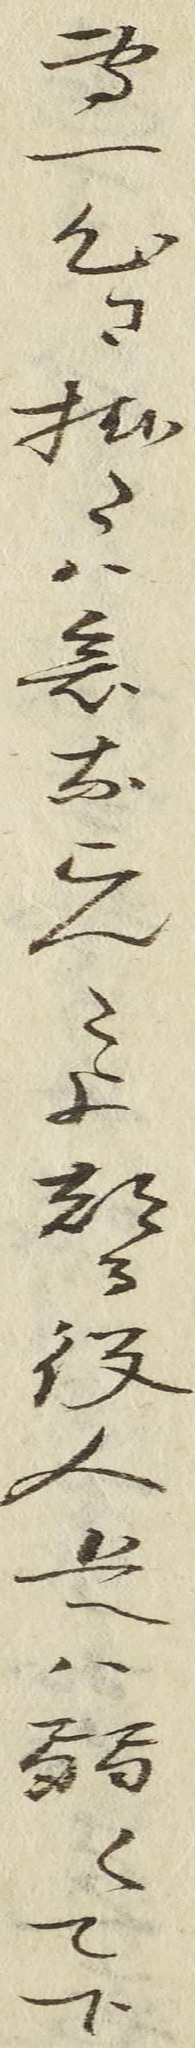専一心に振たハ忝なこんたよ斯る役人上へハ弱くて下
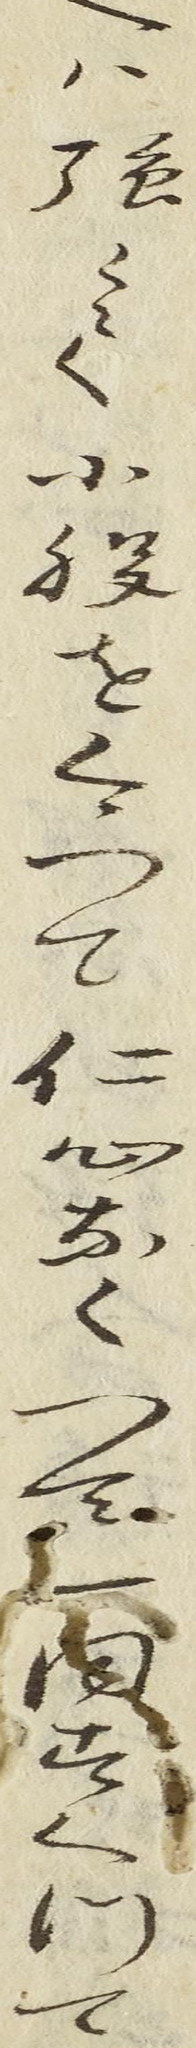へハ強くて小股をくゝつて仁心なくつて一同すくつて
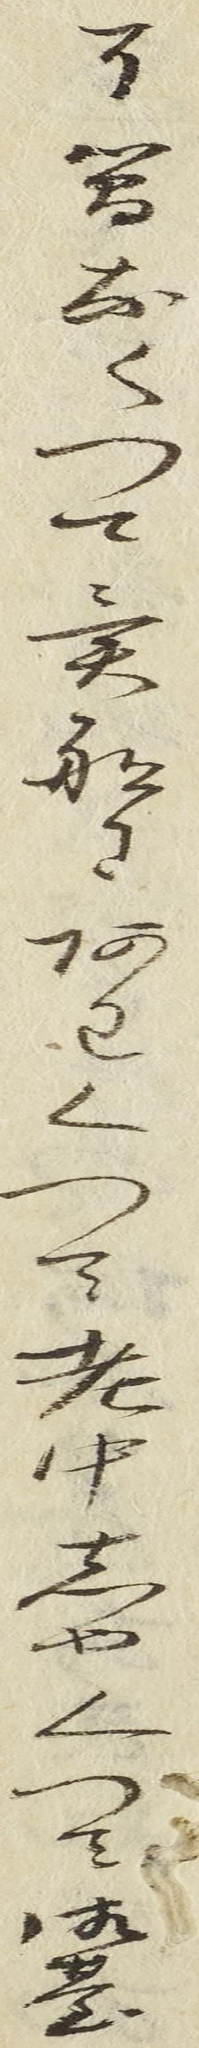了間なくつて異船にあわくつて老中しやくつて御台
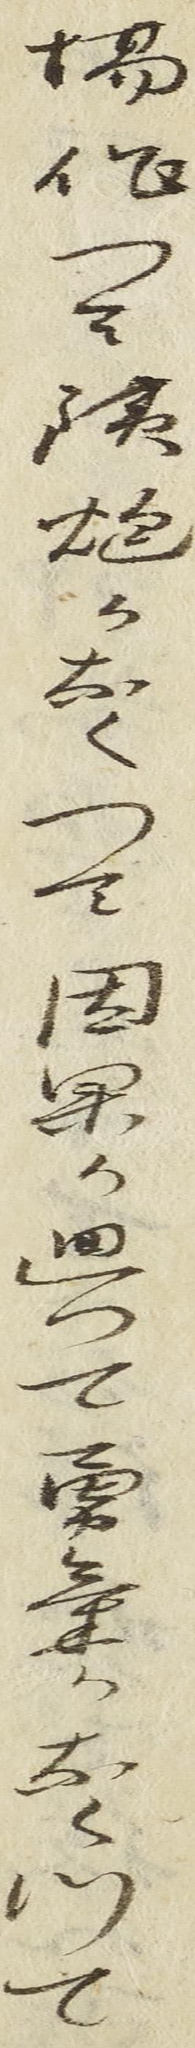場作つて鉄炮かなくつて因果か廻つて勇気かなくつて
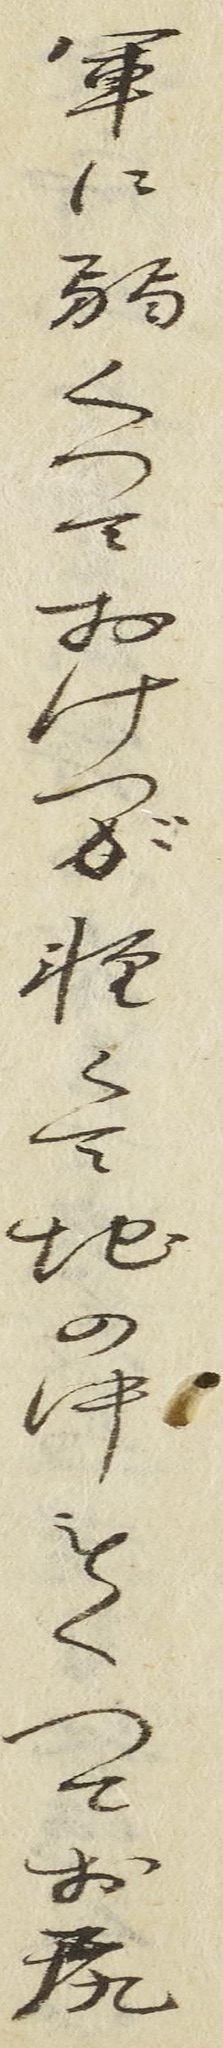軍に弱くつておけつが軽くて地の中もくつてお尻
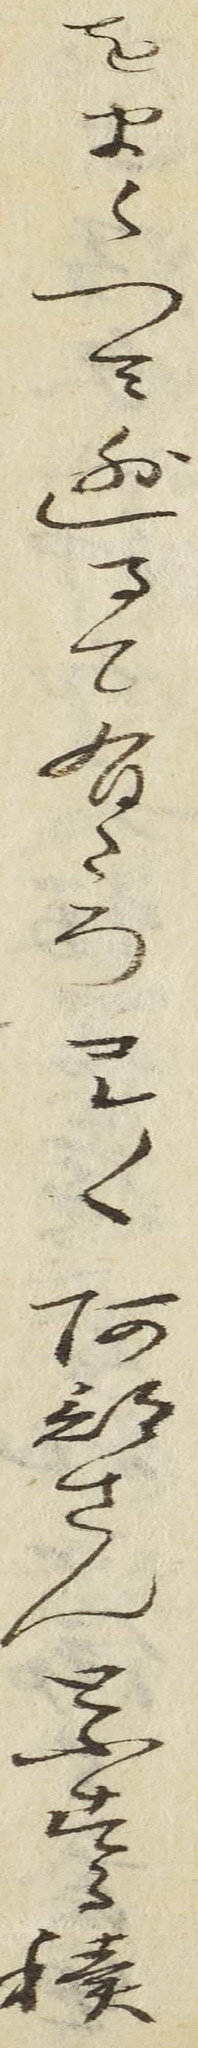をまくつて逃るて有たろコレ〳〵阿部さんとふする積
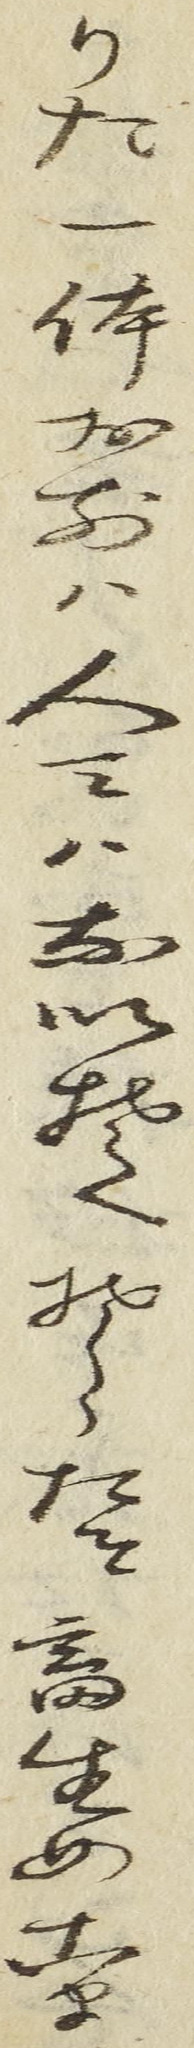りた一体お前ハ人てハないそへそうたそ畜生めこま
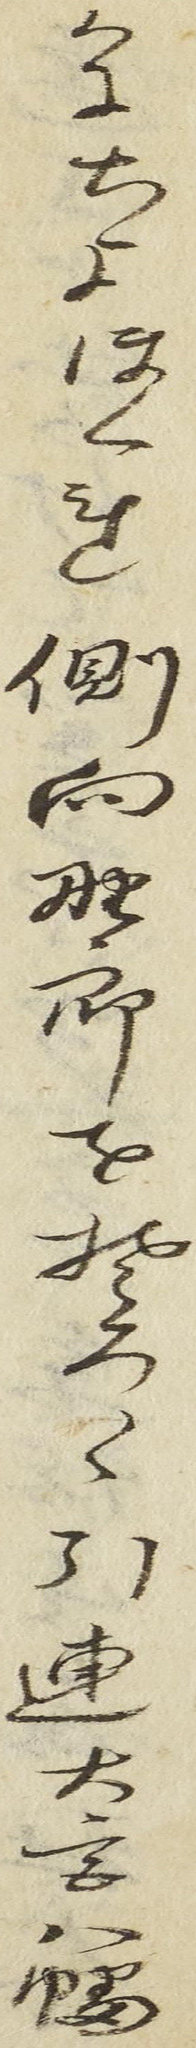かにちよほくれ側向野郎をそろ〳〵引連大宮八幡

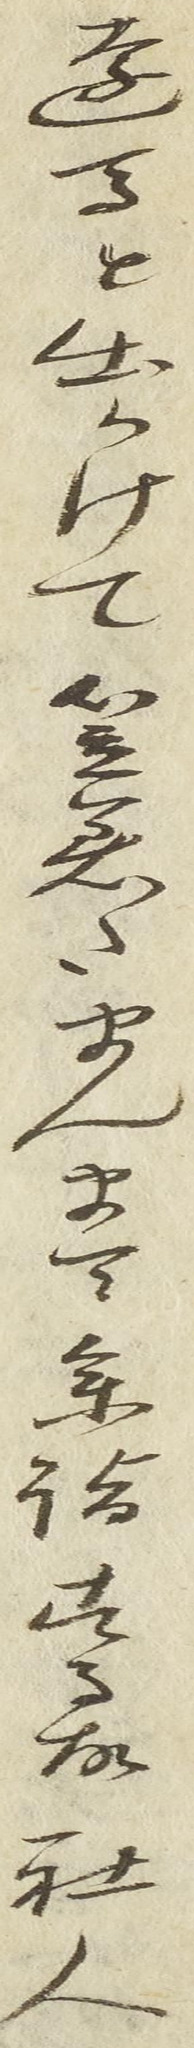遠馬と出かけて笠着たまんまて参詣する故社人
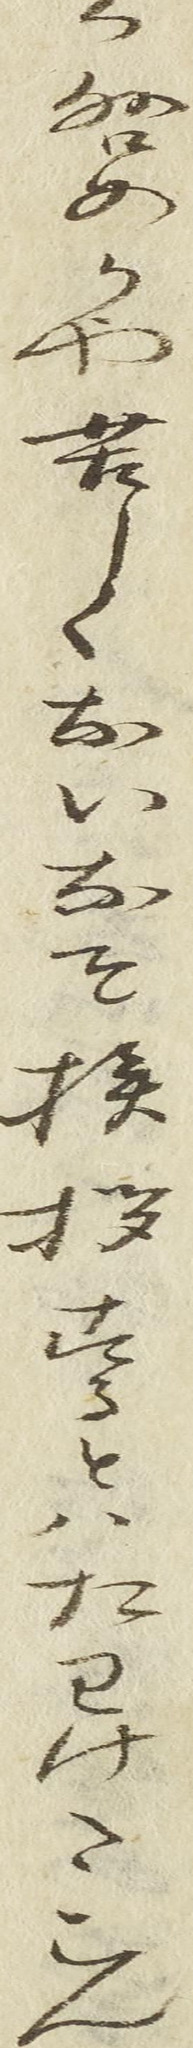か咎めりや苦しくないなそ挨拶とハたわけたこん
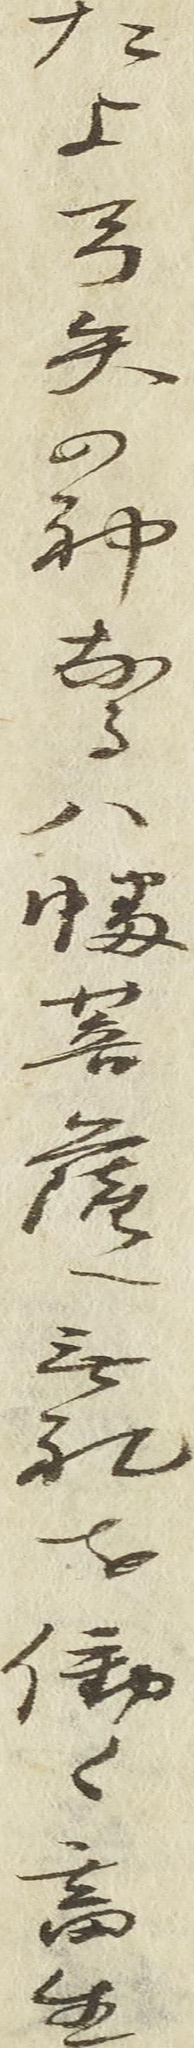たよ弓矢の神なる八幡菩薩へ無礼を働く畜生
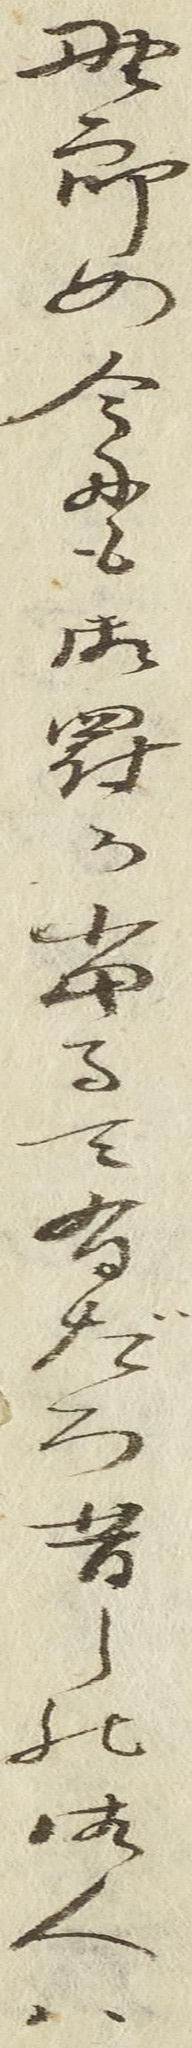野郎め今にも御罰か当るて有だろ昔しの御人ハ
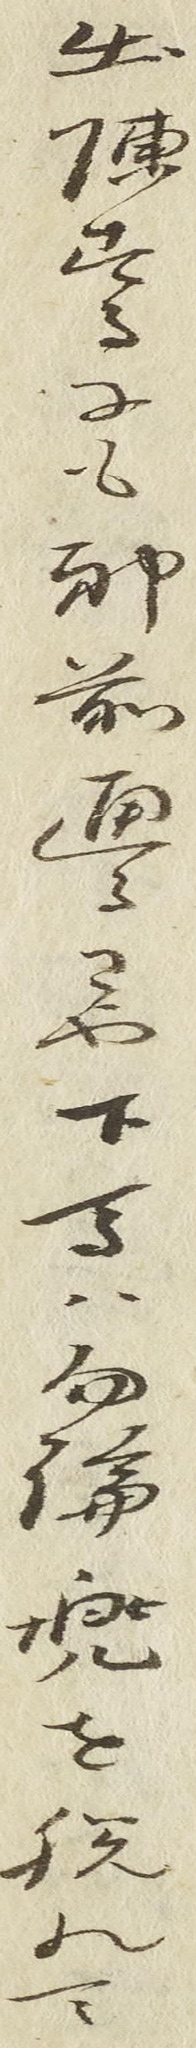出陣するにも神前通るにや下馬ハ勿論兜を脱んて
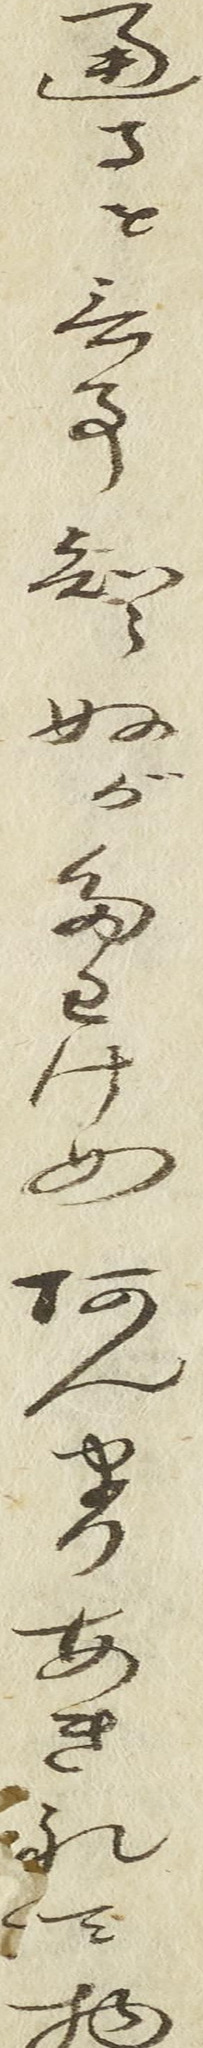通ると云事知らぬがたわけめあんまりあきれて物
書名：世説ヤンレフシ写、駿州田中城地震ニ付内外破損御届書、豫州大洲城地震ニ付内外破損御届書・封廻状
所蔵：東京大学地震研究所図書室 Earthquake Research Institute Library, The University of Tokyo, JAPAN
